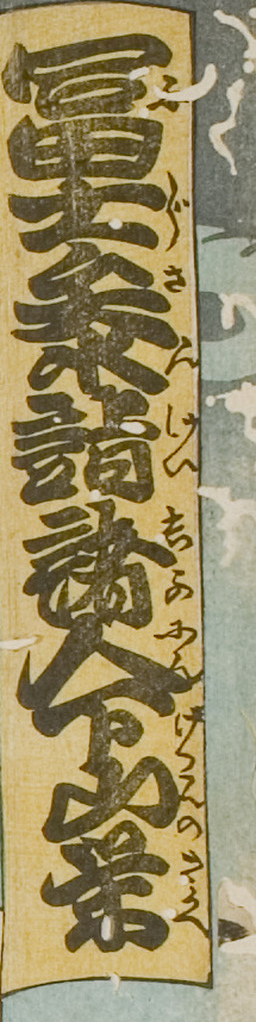富士参詣諸人下山栄
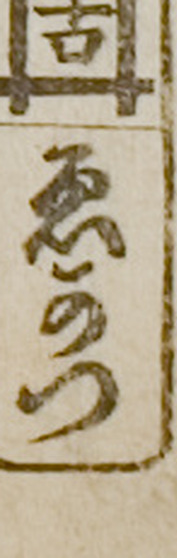ゑかつ
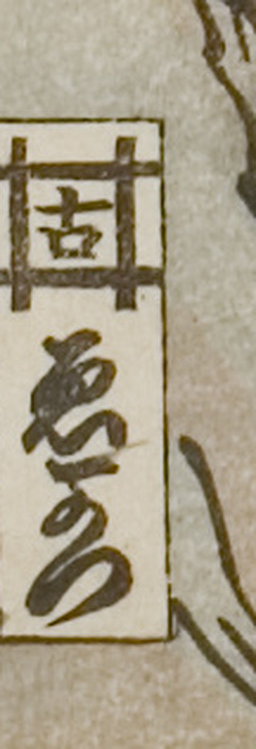ゑかつ

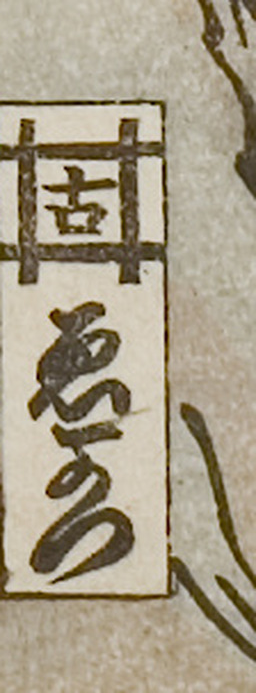ゑかつ
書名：富士参詣諸人下山栄
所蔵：東京大学総合図書館 General Library in the University of Tokyo, JAPAN
